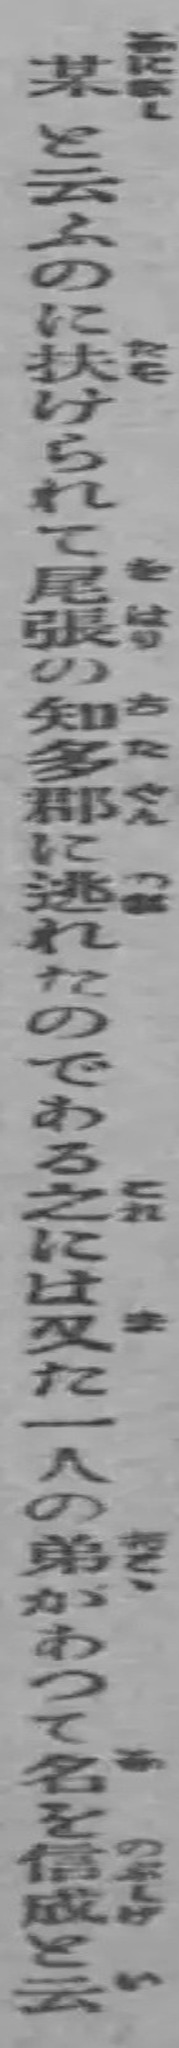某と云ふのに扶けられて尾張の知多郡に逃れたのである之には又た一人の弟があつて名を信成と云
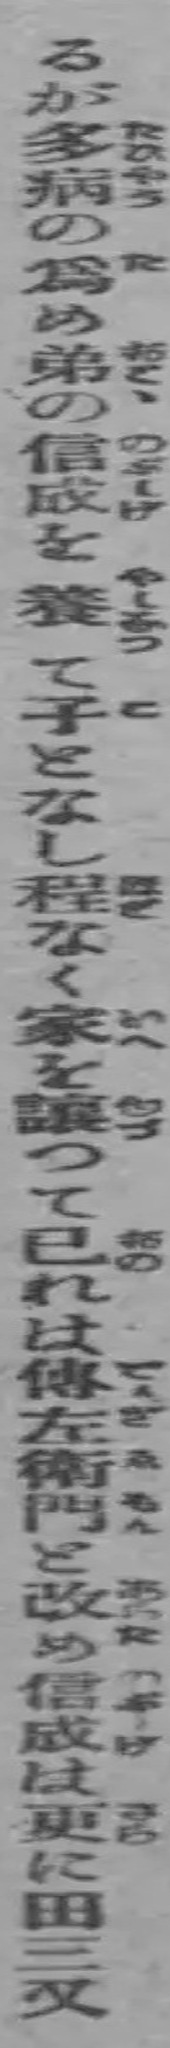牧野信成るが多病の為め弟の信成を養て子となし程なく家を譲つて巳れは傳左衛門と改め信成は更に田三又
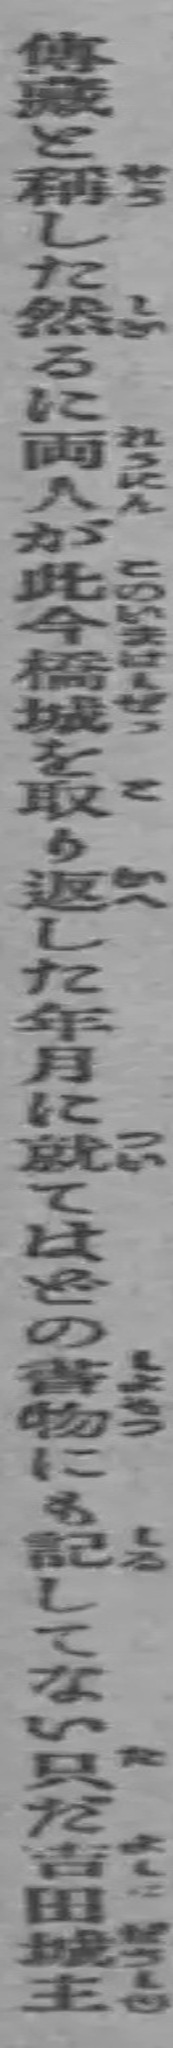傳蔵と称した然るに両人が此今橋城を取り返した年月に就てはどの書物にも記してない只だ吉田城主

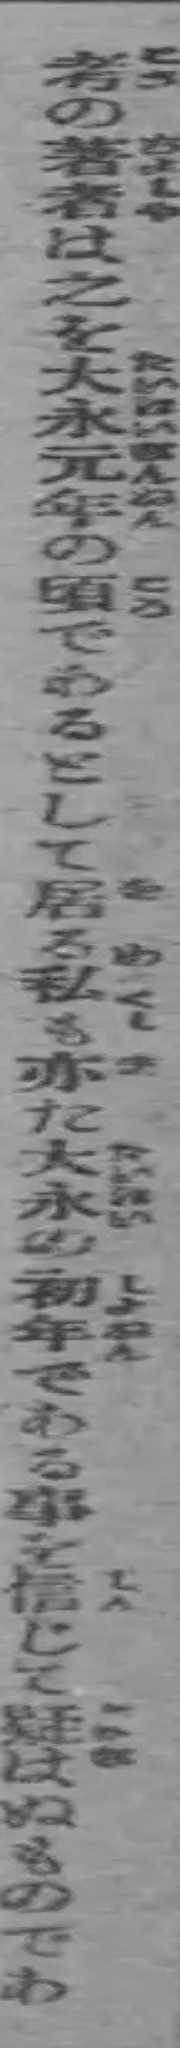考の著者は之を大永元年の頃であるとして居る私も亦た大永の初年である事を信じて疑はぬものであ
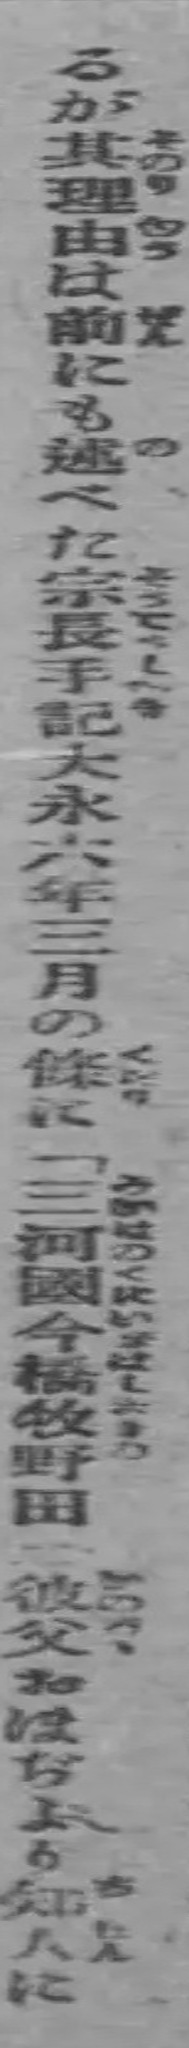るが其理由は前にも述べた宗長手記大永六年三月の条に「三河国今橋牧野田三彼父おほぢより知人に
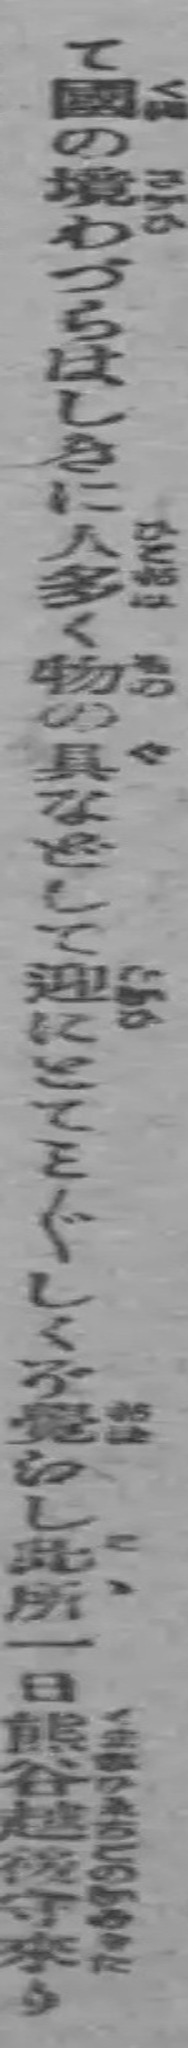て国の境わづらはしきに人多く物の具などして迎にとてこと〴〵しくぞ覚えし此所一日熊谷越後守来り
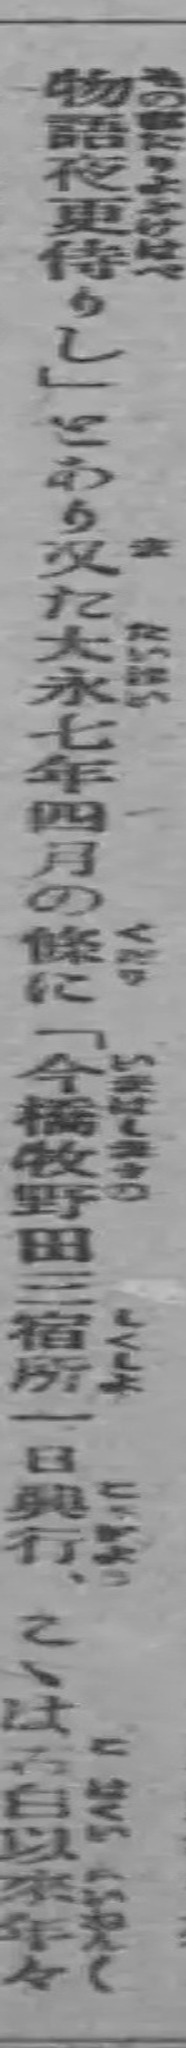物語夜更侍りし」とあり又た大永七年四月の条に「今橋牧野田三宿所一日興行、こゝは古白以来年々
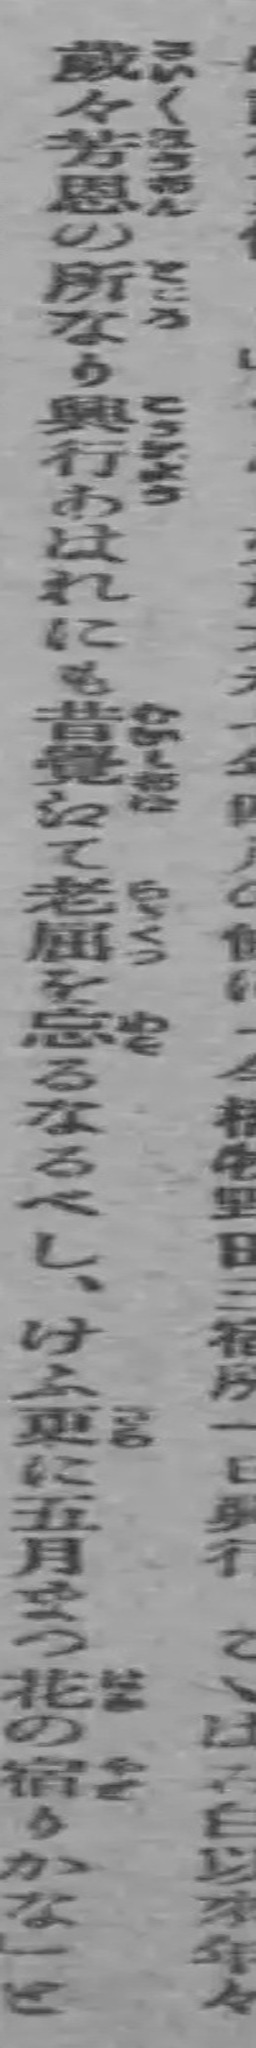歳々芳恩の所なり興行あはれにも昔覚えて老屈を忘るなるべし、けふ更に五月まつ花の宿りかな」と
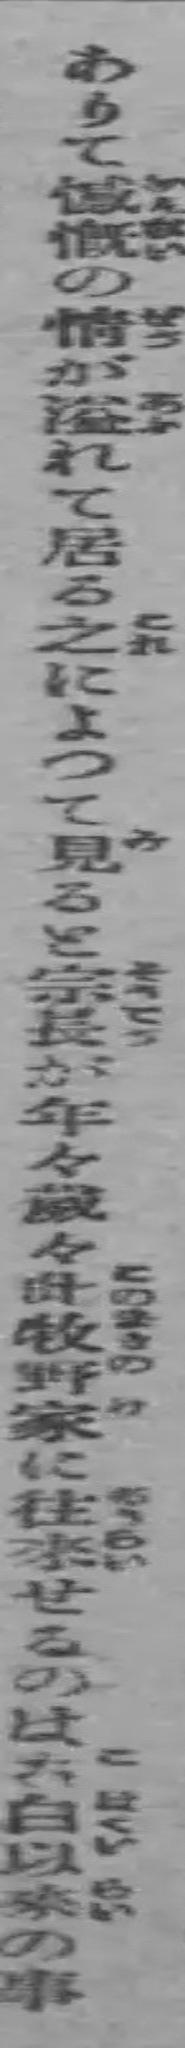ありて憾慨の情が溢れて居る之によつて見ると宗長が年々歳々此牧野家に往来せるのは古白以来の事
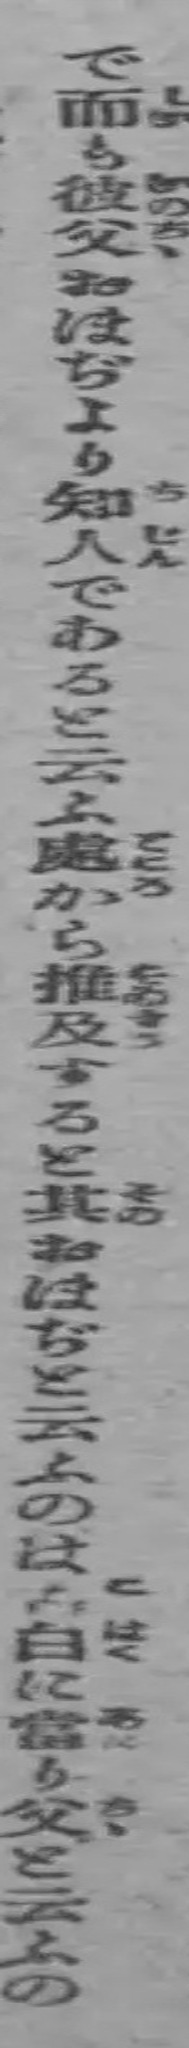で而も彼父おほぢより知人であると云ふ処から推及すると其おほぢと云ふのは古白に当り父と云ふの
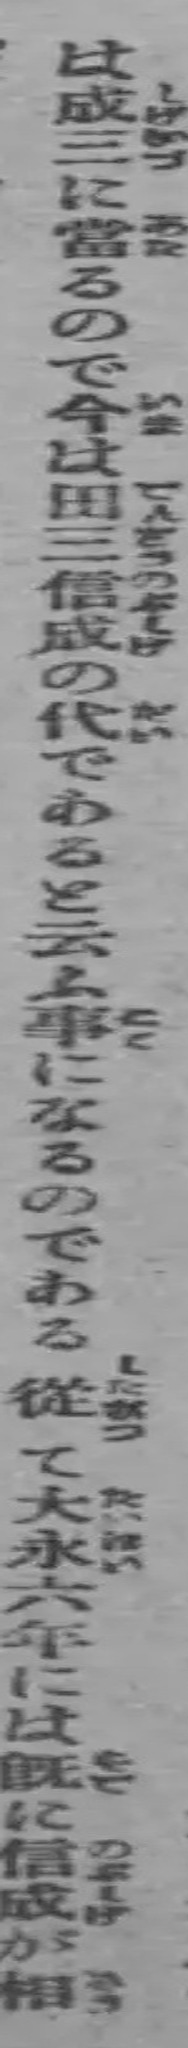は成三に当るので今は田三信成の代であると云ふ事になるのである従て大永六年には既に信成が相
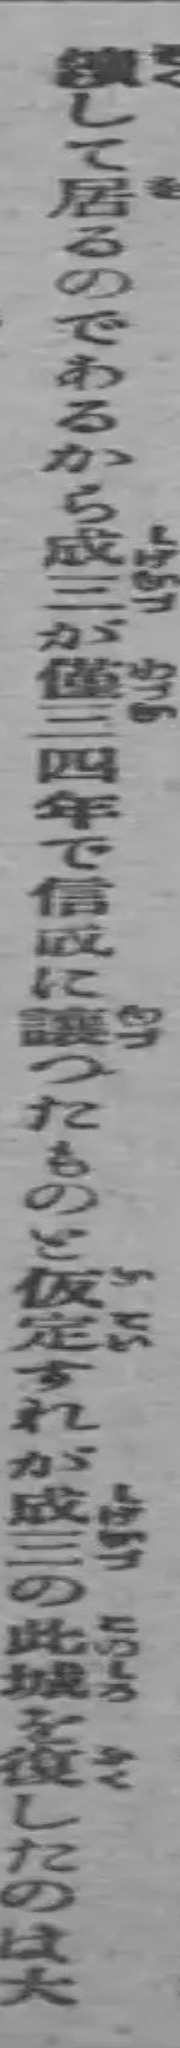続して居るのであるから成三が僅三四年で信成に譲つたものと仮定すれが成三の此城を復したのは大
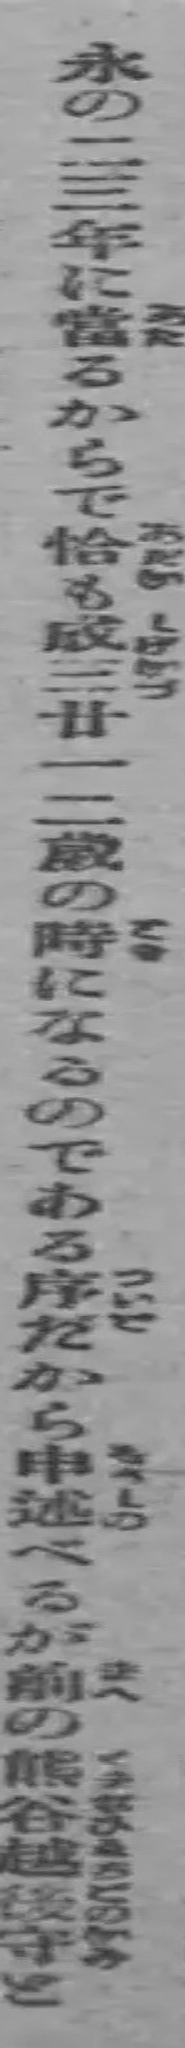永のニ三年に当るからで恰も成三廿一二歳の時になるのである序だから申述べるが前の熊谷越後守と
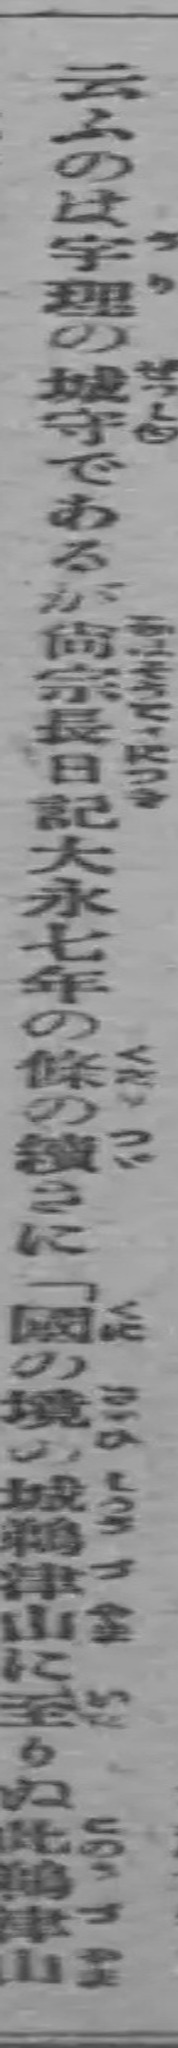鵜津山云ふのは宇理の城守であるが尚宗長日記大永七年の条の続きに「国の境の城鵜津山に至りぬ此鵜津山
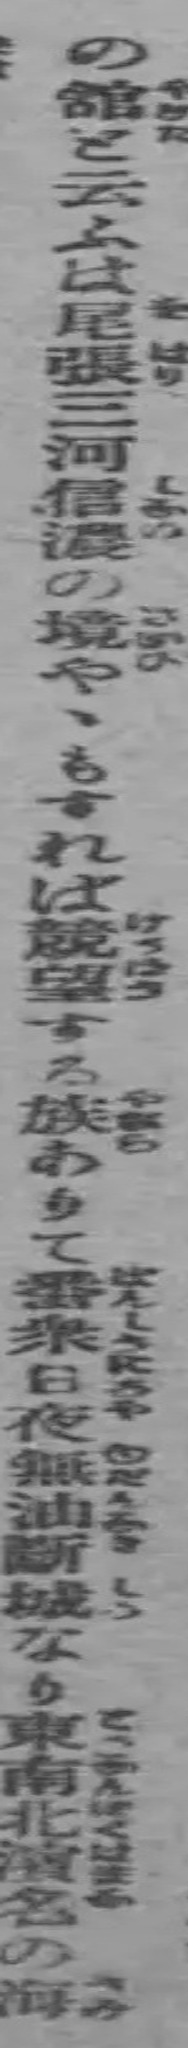の館と云ふは尾張三河信濃の境やゝもすれば競望する族ありて番衆日夜無油断城なり東南北浜名の海
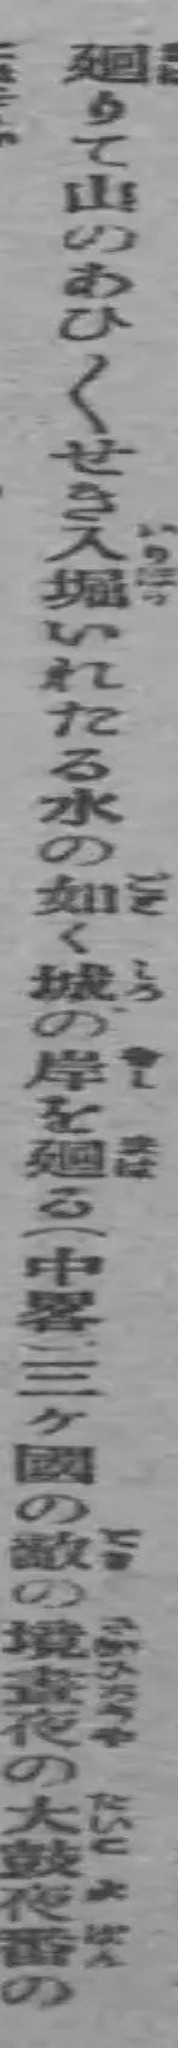廻りて山のあひ〳〵せき入堀いれたる水の如く城の岸を廻る(中略)三ケ国の敵の境昼夜の太鼓夜番の
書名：豊橋市史談
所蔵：国立国会図書館 National Diet Library, JAPAN
